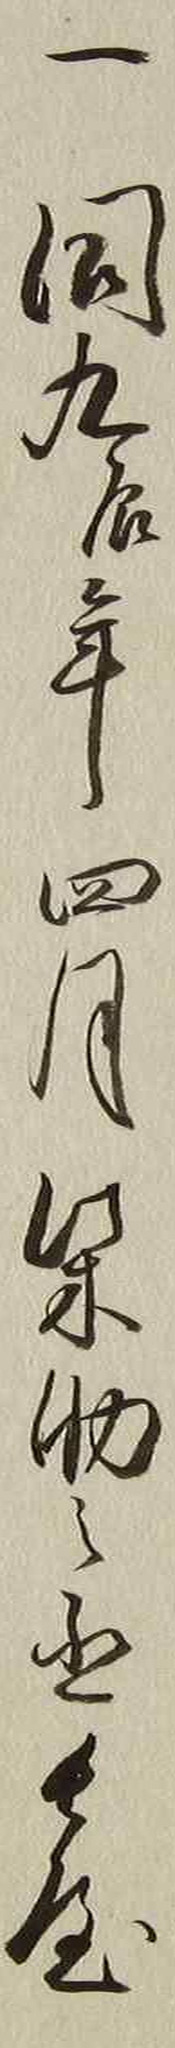一同九辰年四月柴助之丞長屋
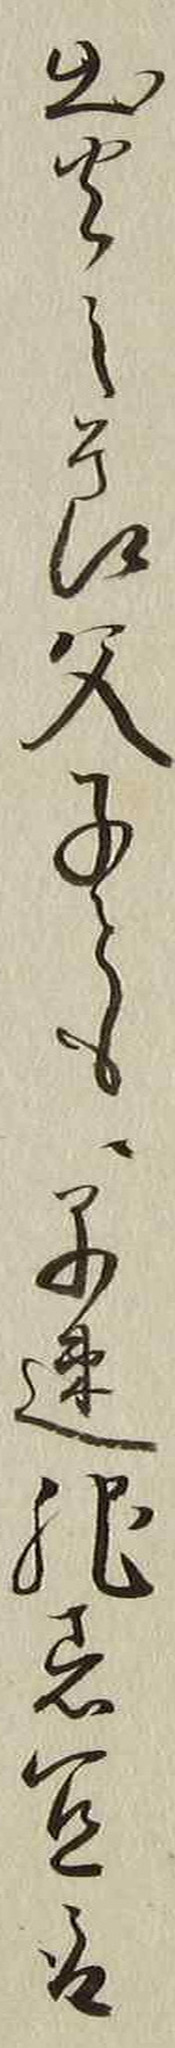出火之節父子とも早速馳着宜取
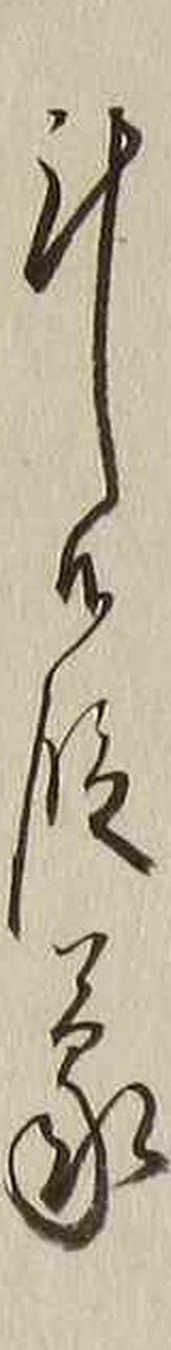計候段蒙
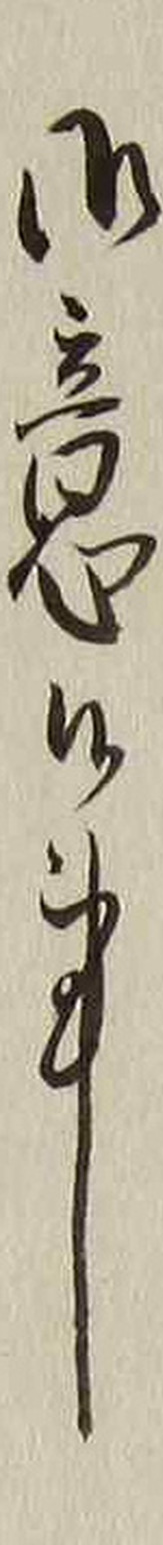御意候事
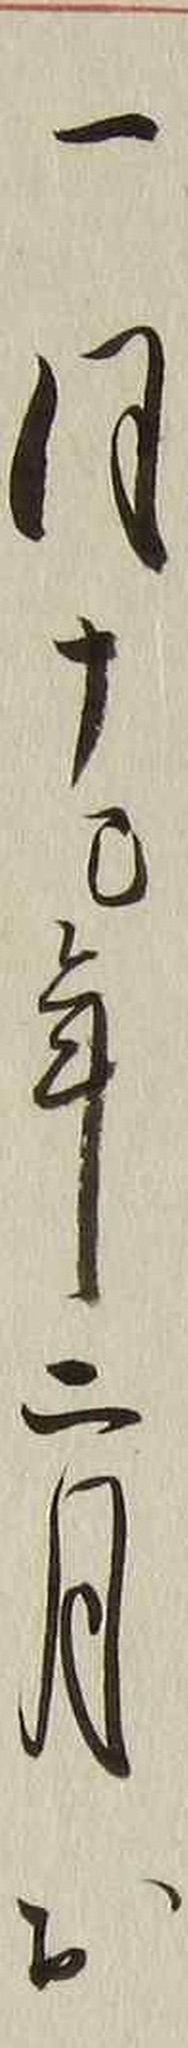一同十巳年二月於
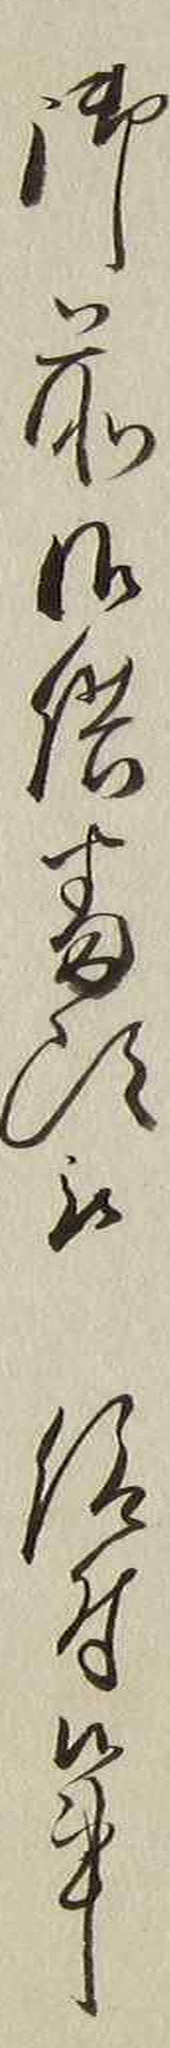御前御供番頭被仰付候事
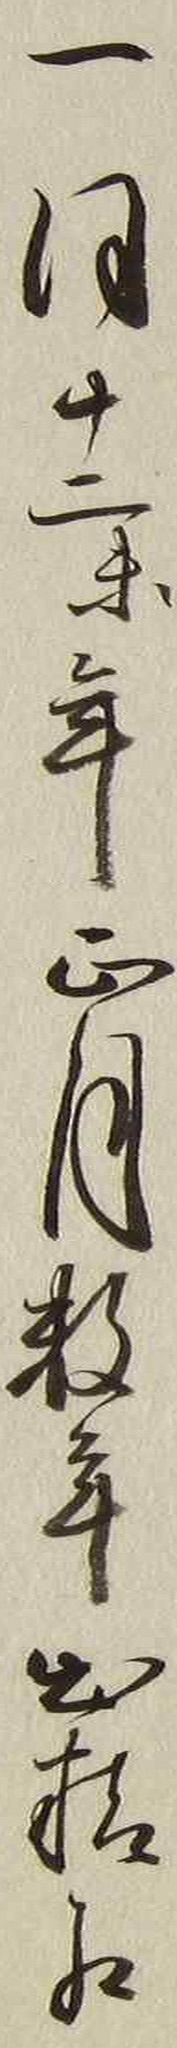一同十二未年正月数年出精相
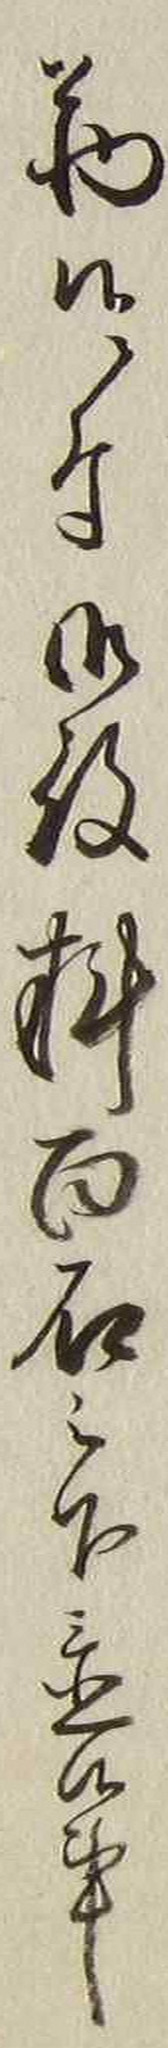勤候ニ付御役料百石被下置候事
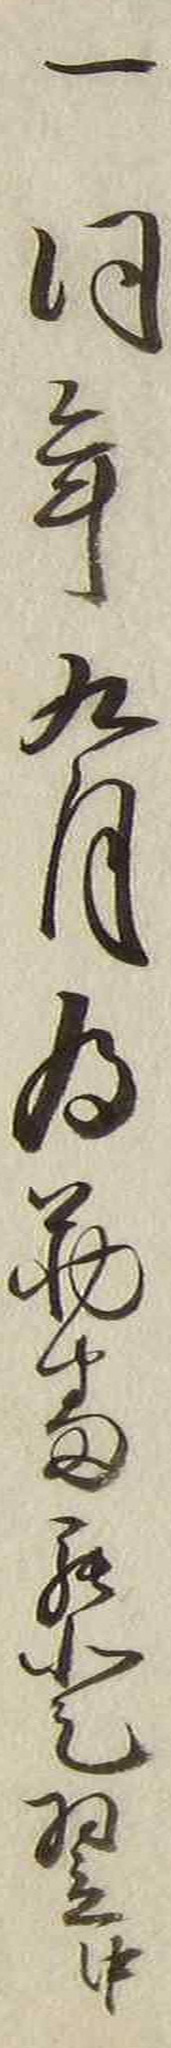一同年九月為勤番罷登翌申

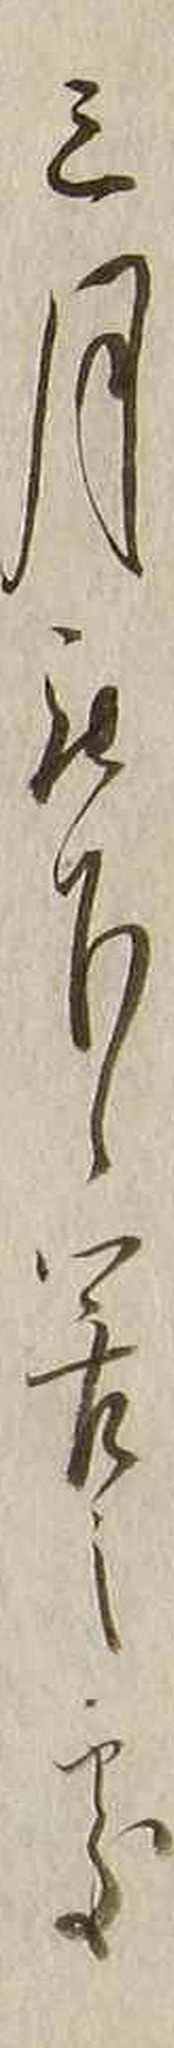三月罷下候筈之処
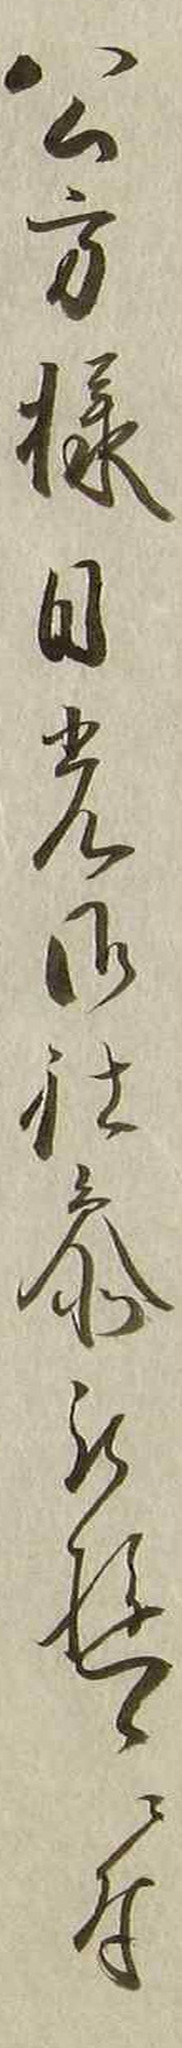公方様日光御社参被遊候ニ付
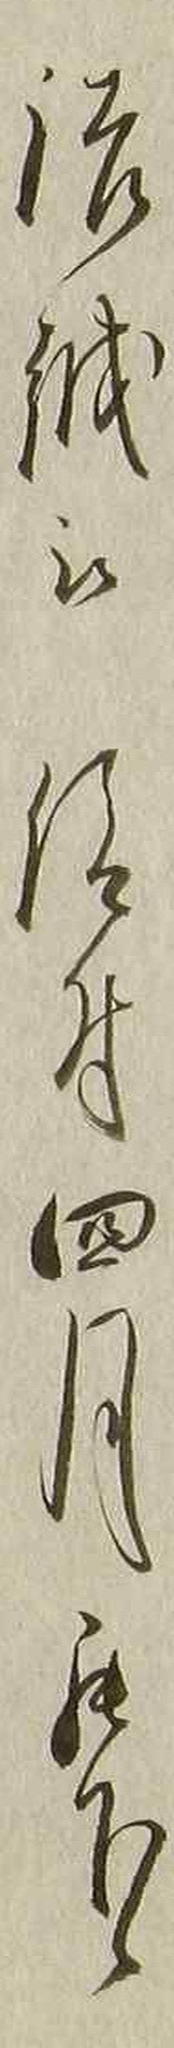詰越被仰付四月罷下候
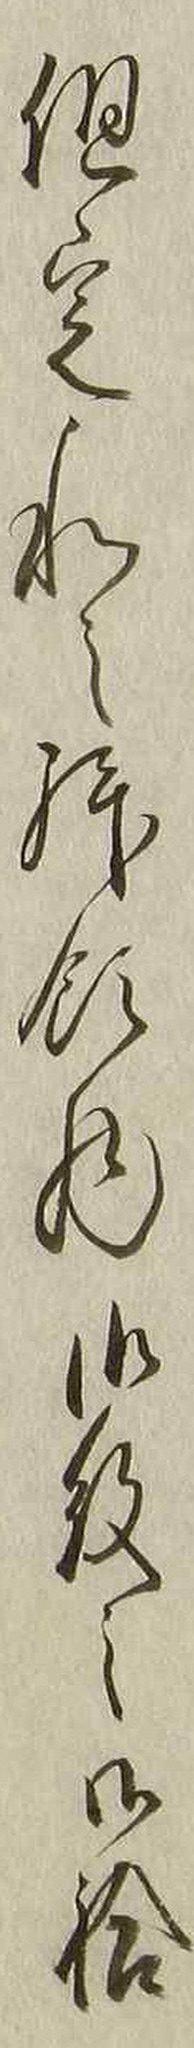但定和之拝領物御紋之御袷
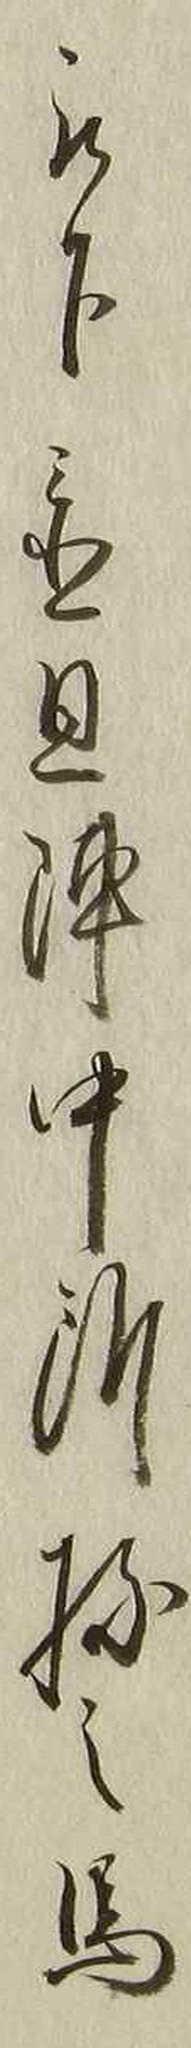被下置陣中所持之馬
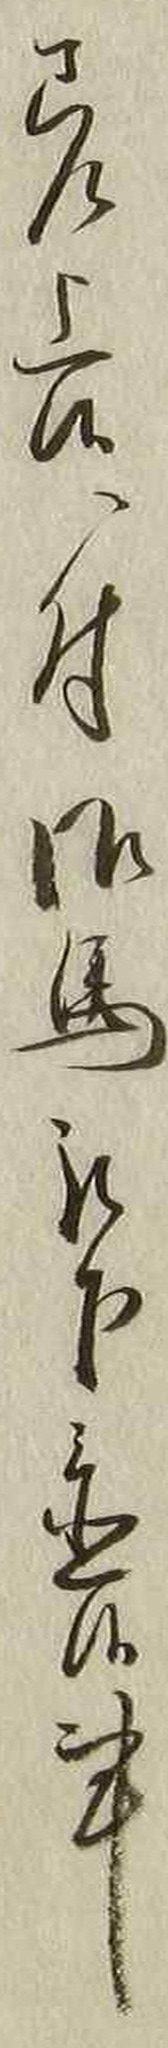差上候ニ付御馬被下置候事
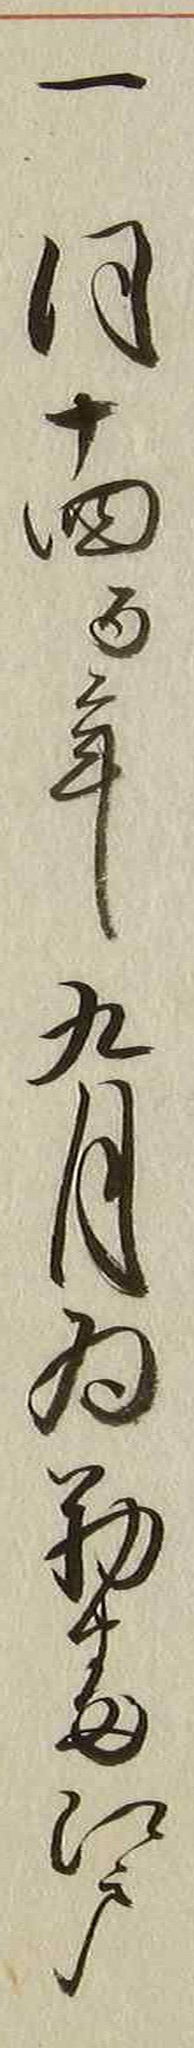一同十四酉年九月為勤番江戸
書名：諸士系譜　巻之18　い之部18
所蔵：会津若松市立会津図書館
